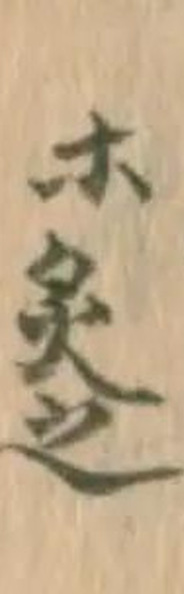等炙之
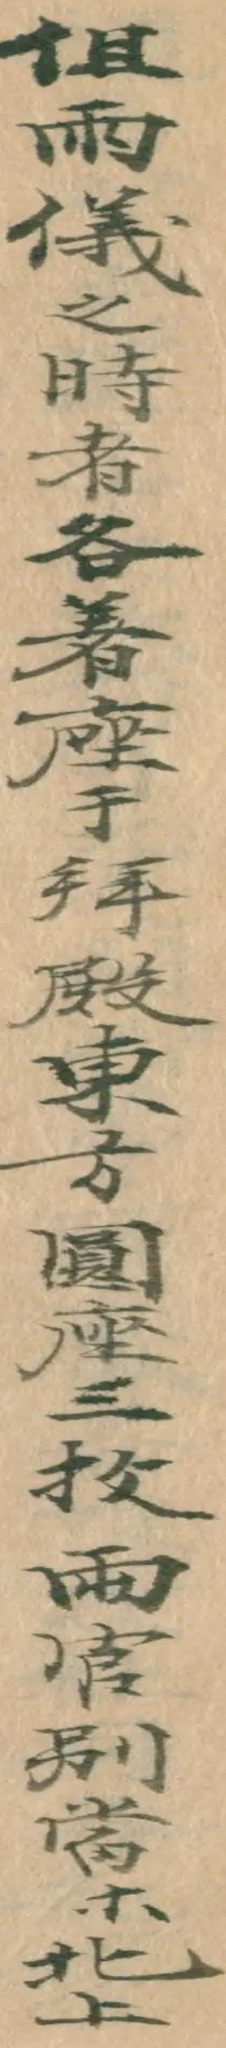但雨儀之時者各着座于拝殿東方円座三枚両官別当等北上
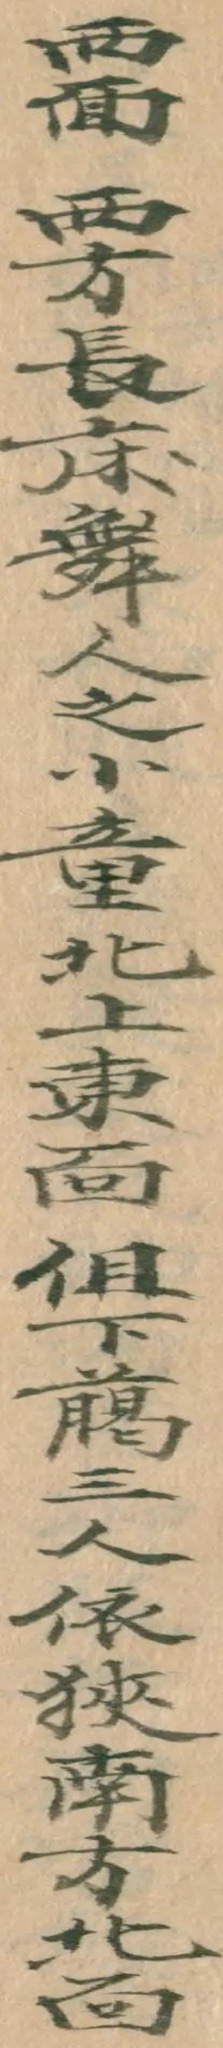西面西方長床舞人之小童北上東面但下臈三人依狭南方北面
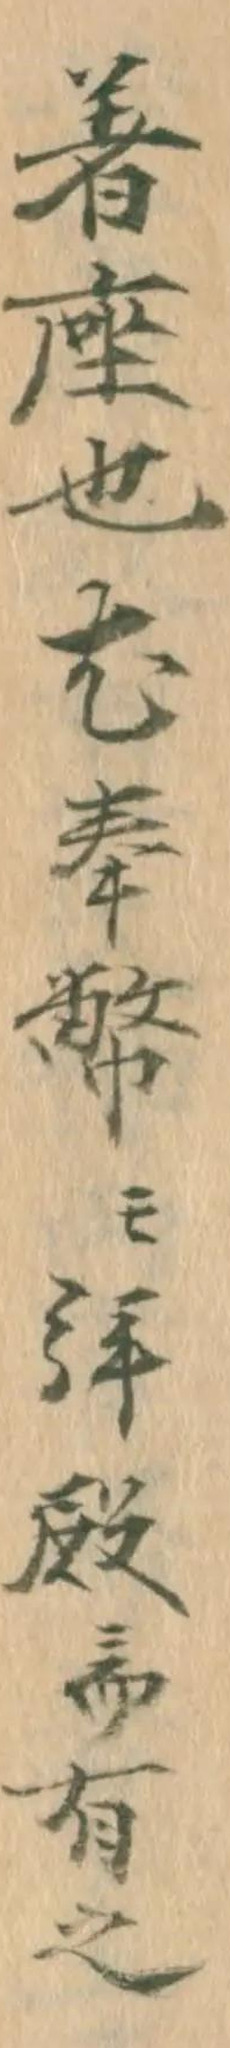着座也尤奉幣モ拝殿ニ而有之

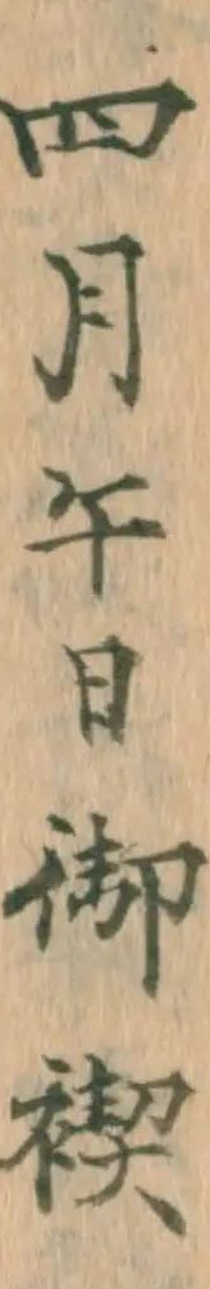四月午日御禊
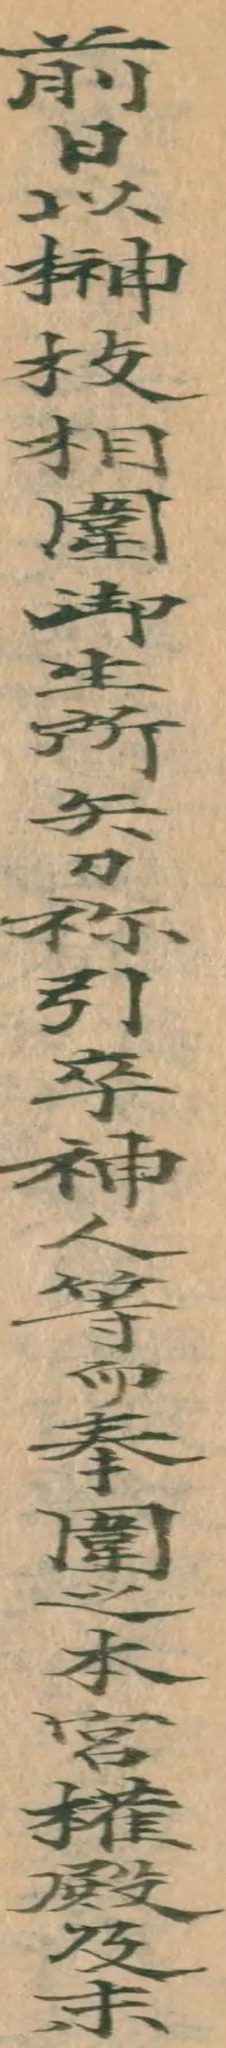前日以榊枝相囲御生所矢刀禰引卒神人等而奉囲之本宮権殿及末
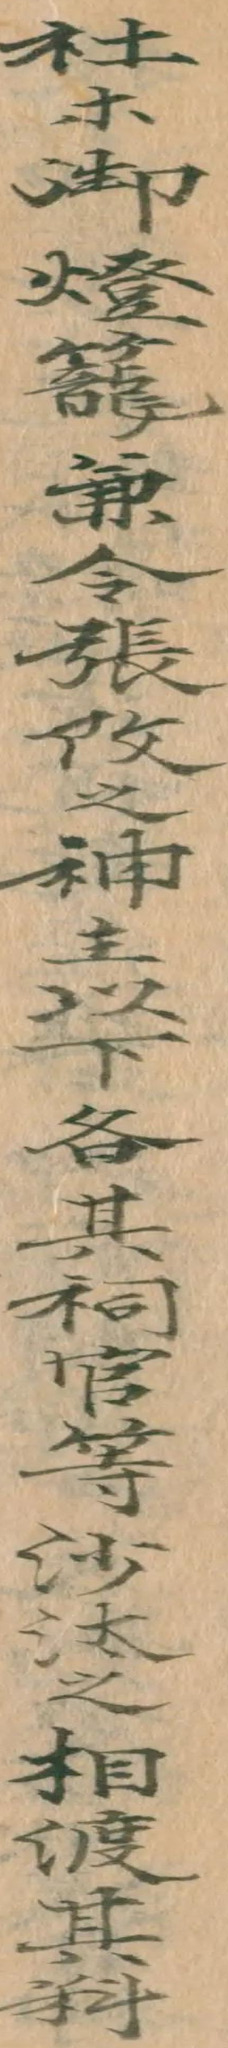社等御燈籠兼令張改之神主以下各其祠官等沙汰之相渡其料
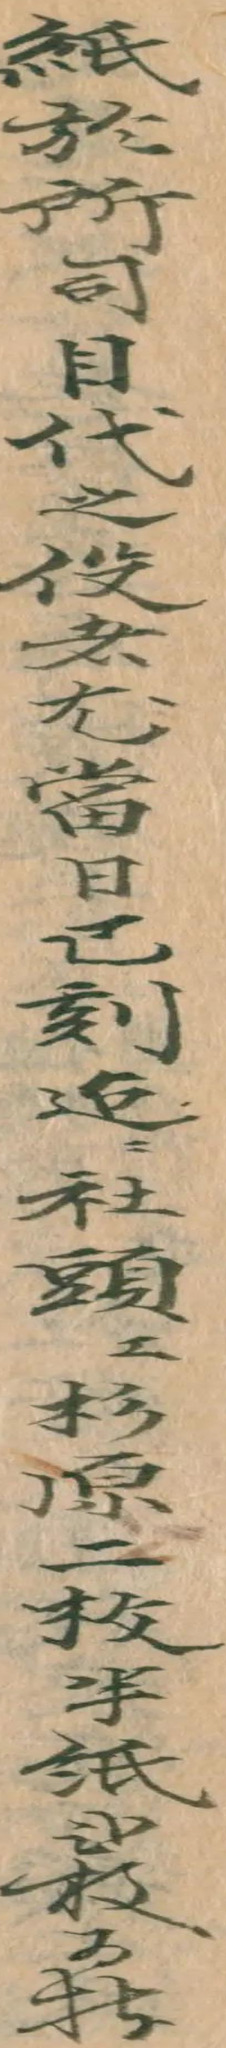紙於所司目代之役者尤当日巳刻迄ニ社頭エ杉原二枚半紙弐枚為持
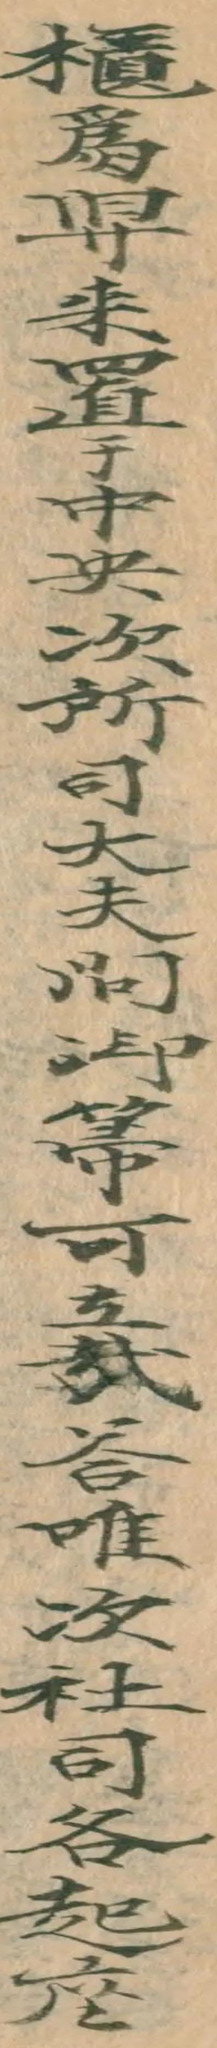櫃為舁来置于中央次所司大夫問御箒可立哉答唯次社司各起座
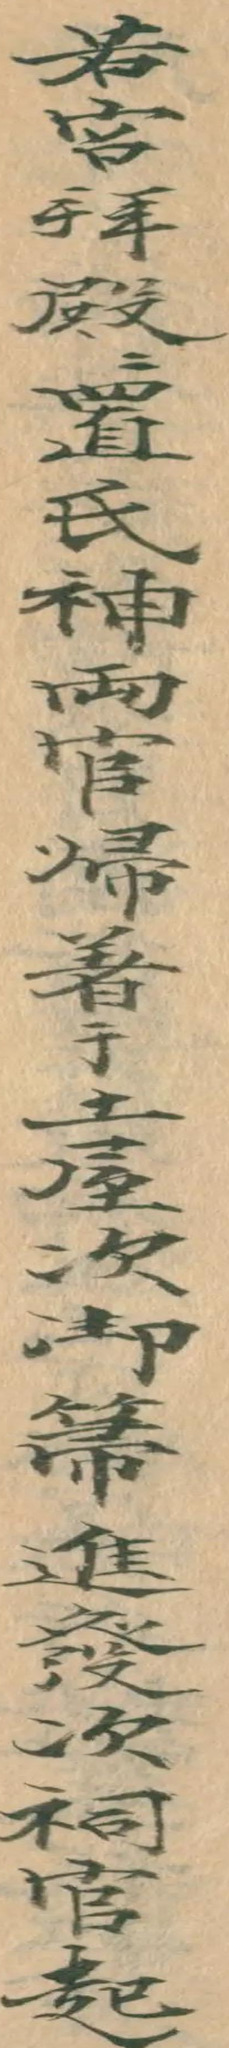若宮拝殿ニ置氏神両官帰着于土屋次御箒進発次祠官起

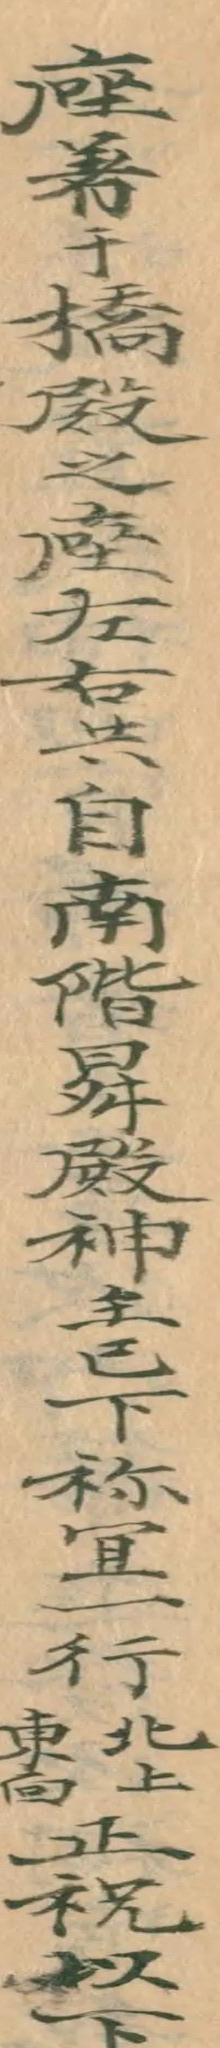座着于橋殿之座左右共自南階昇殿神主已下禰宜一行北上東面正祝以下
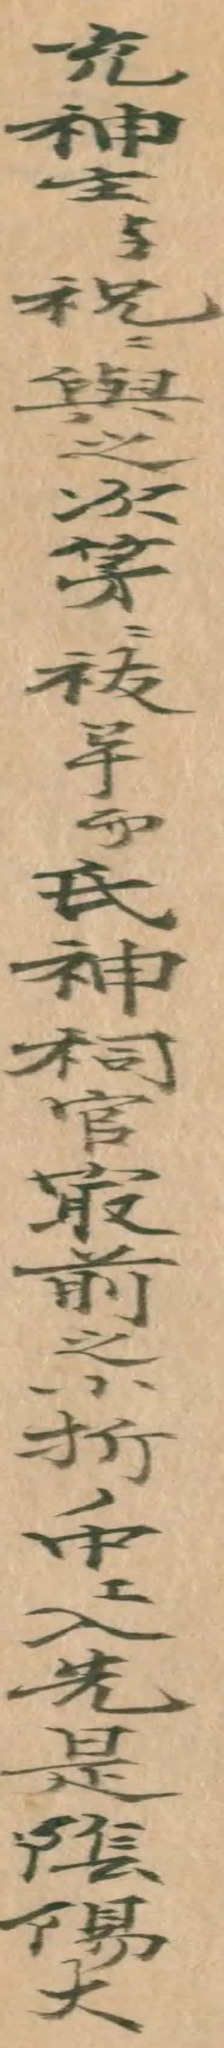充神主与祝ニ与之次第ニ祓畢而氏神祠官最前之小折ノ中江入先是陰陽大
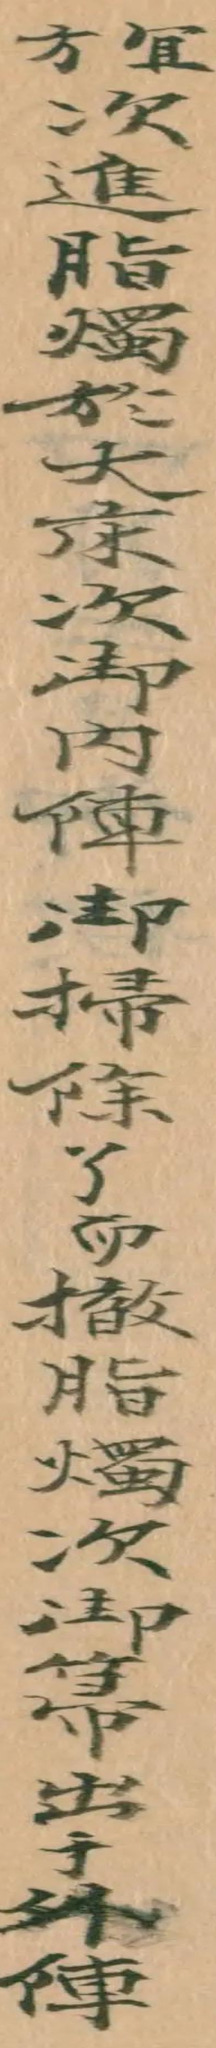宜方次進脂燭於大床次御内陣御掃除了而撤脂燭次御箒出于外陣
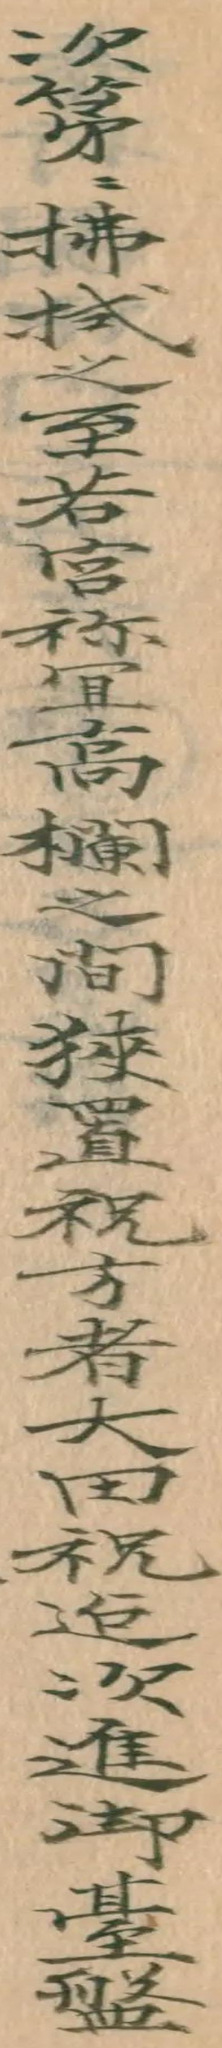次第ニ払拭之至若宮禰宜高欄之間狭置祝方者大田祝迄次進御台盤
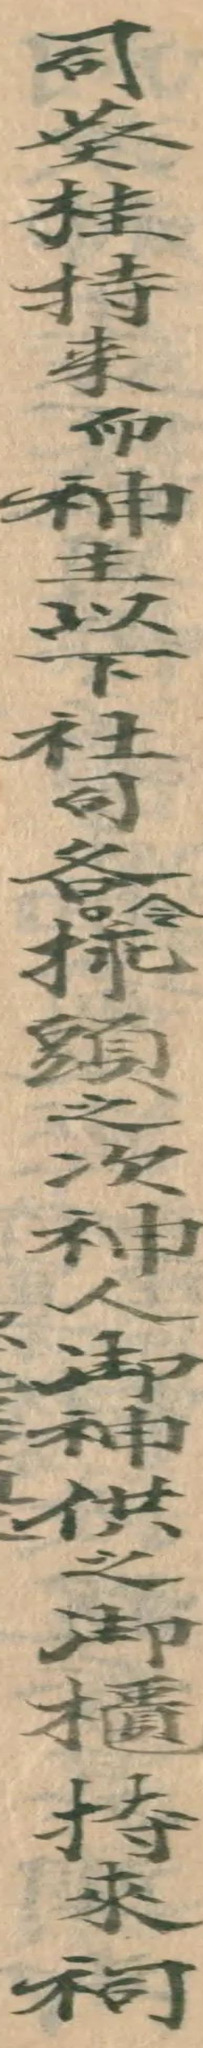司葵桂持来而神主以下社司各令○挿頭之次神人御神供之御櫃持来祠
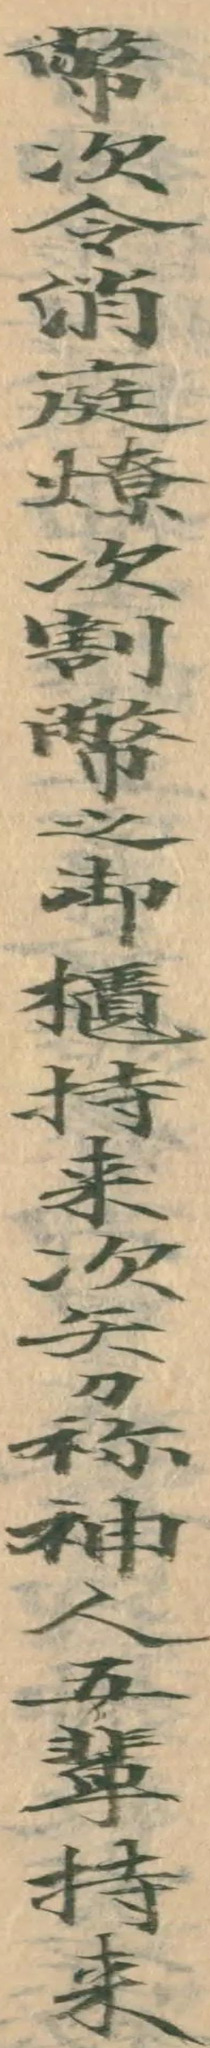幣次令消庭燎次割幣之御櫃持来次矢刀禰神人五輩持来
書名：賀茂社記録. 第5冊
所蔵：国立国会図書館 National Diet Library, JAPAN
